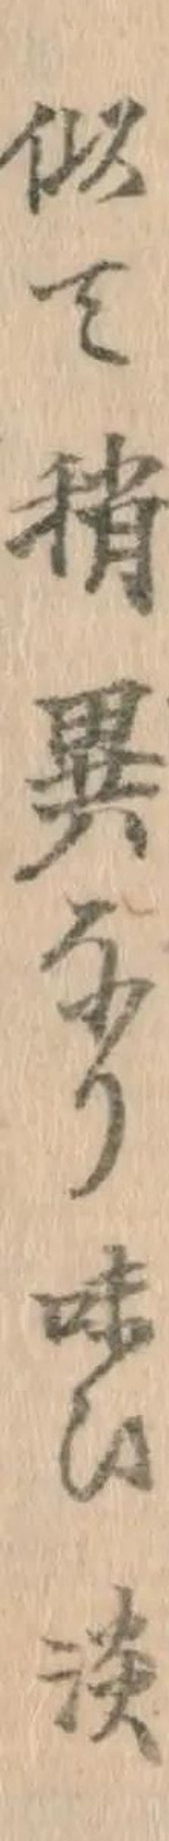似て稍異なり味ひ淡
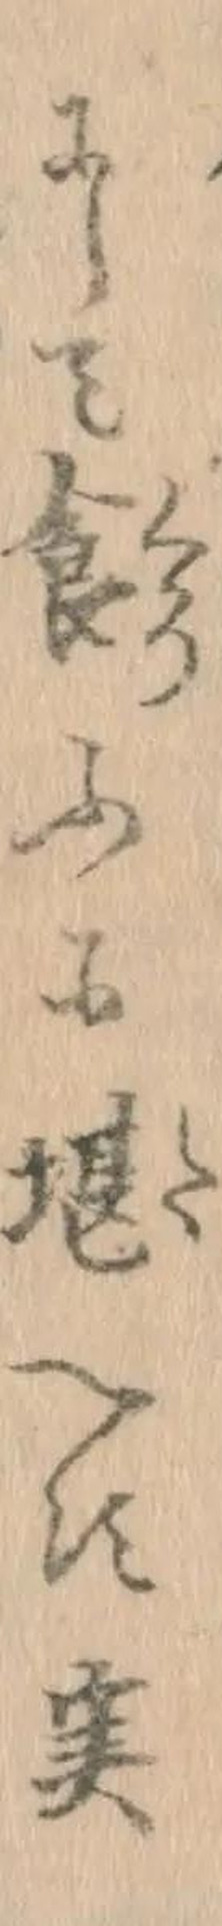にして食ふに堪へす実
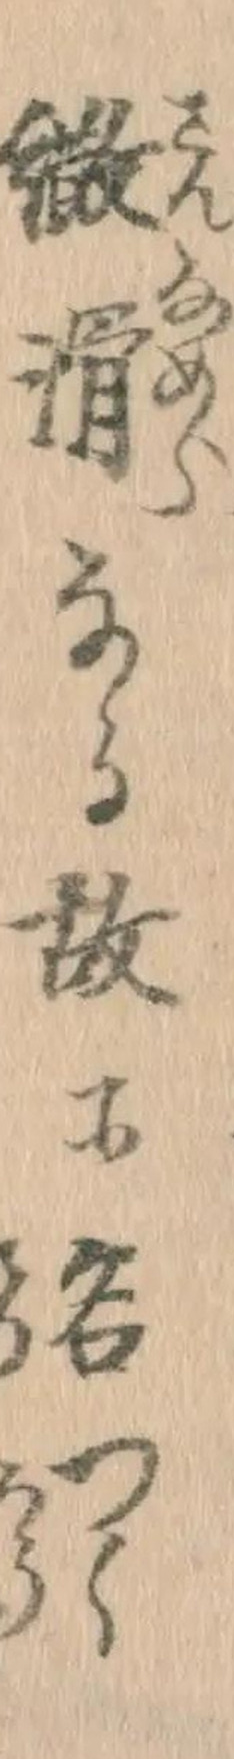繖滑なる故に名つく
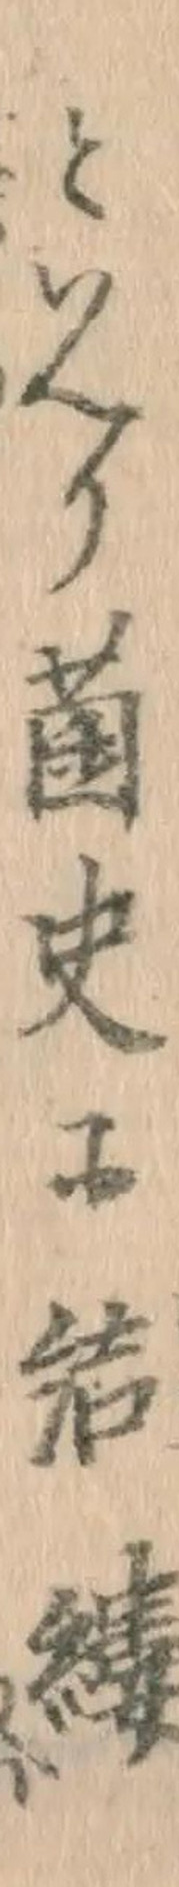といへり菌史に結縷
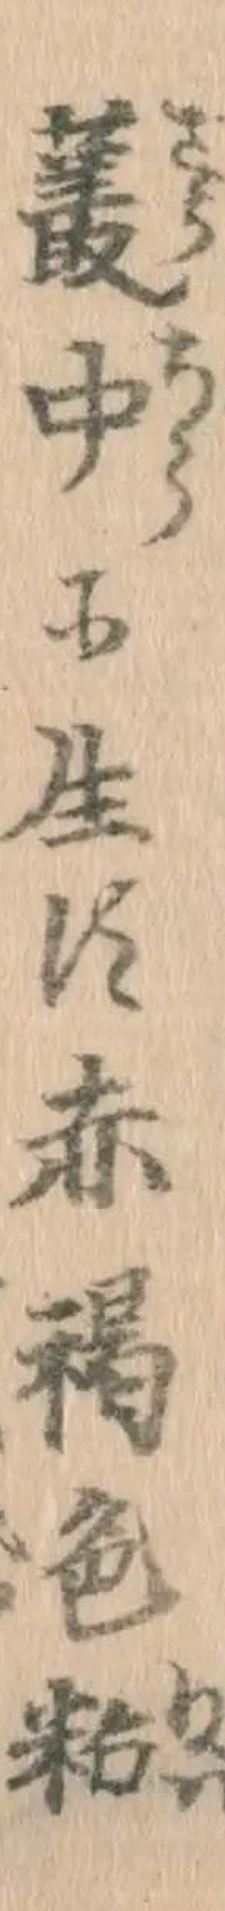叢中に生す赤褐色粘
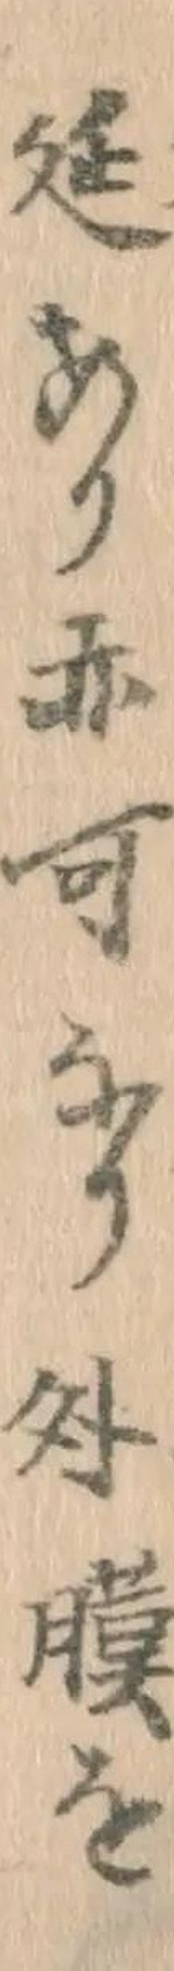延あり亦可なり外膜を
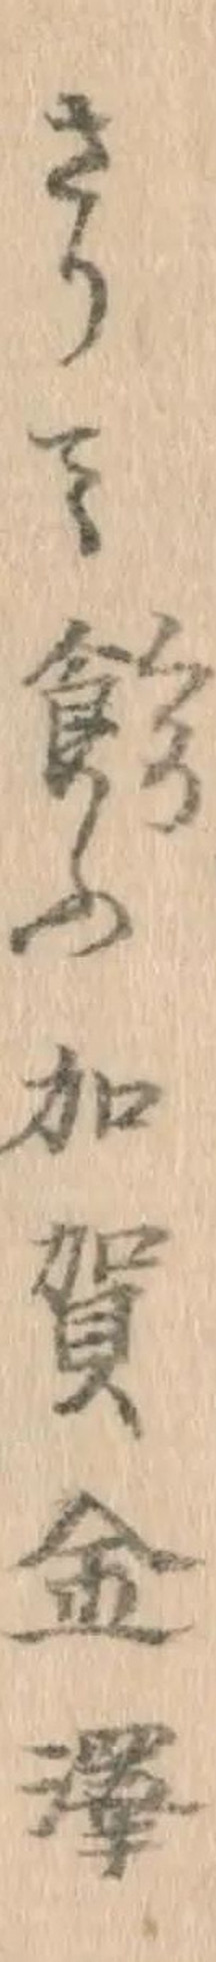さりて食ふ加賀金沢
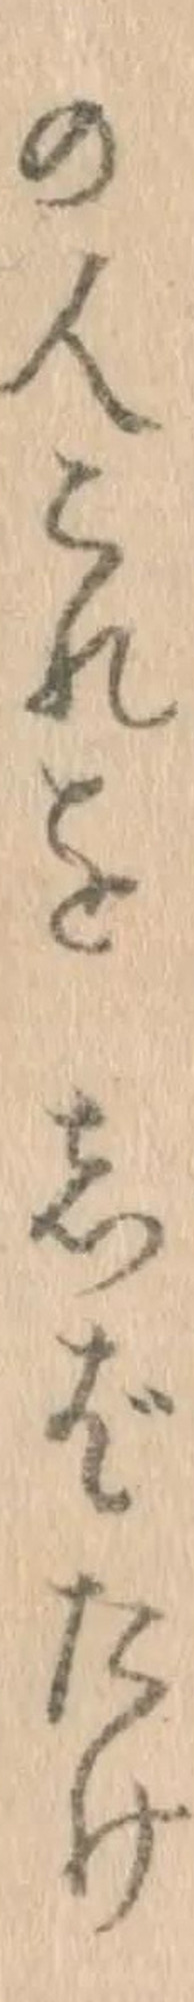の人これをしばたけ

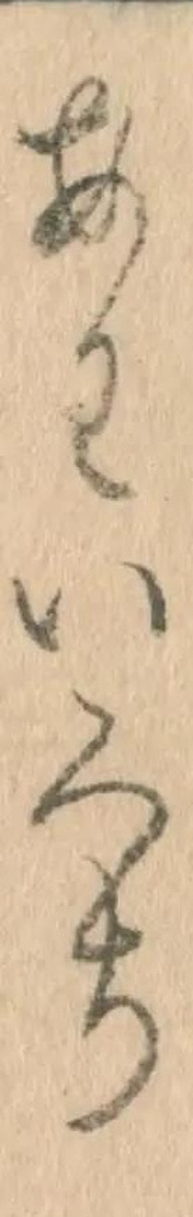あわいくち
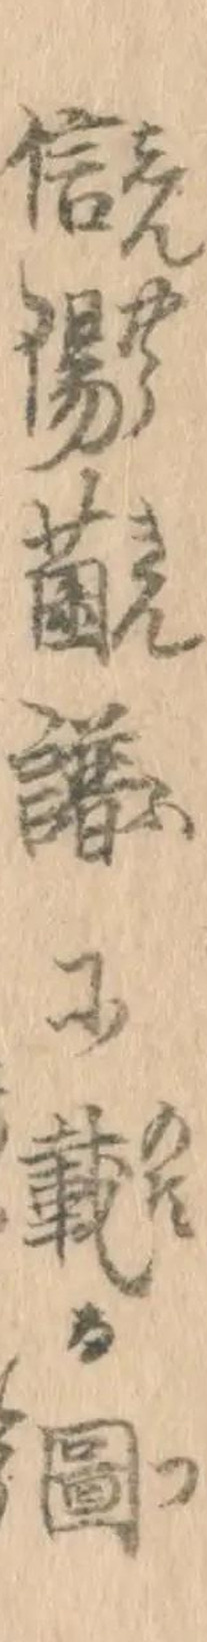信陽菌譜に載る図
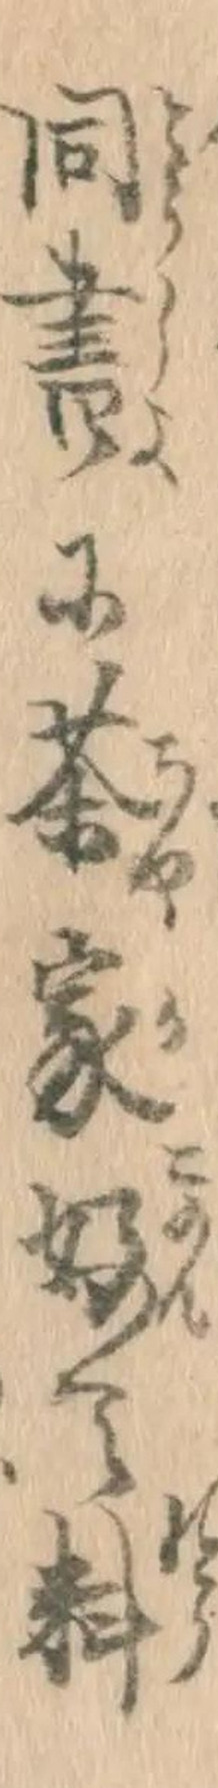同書に茶家好て料
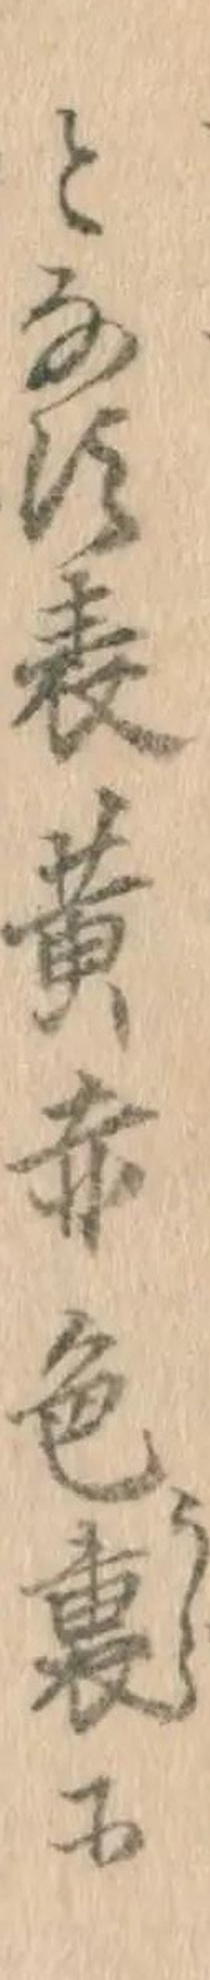となす表黄赤色裏に
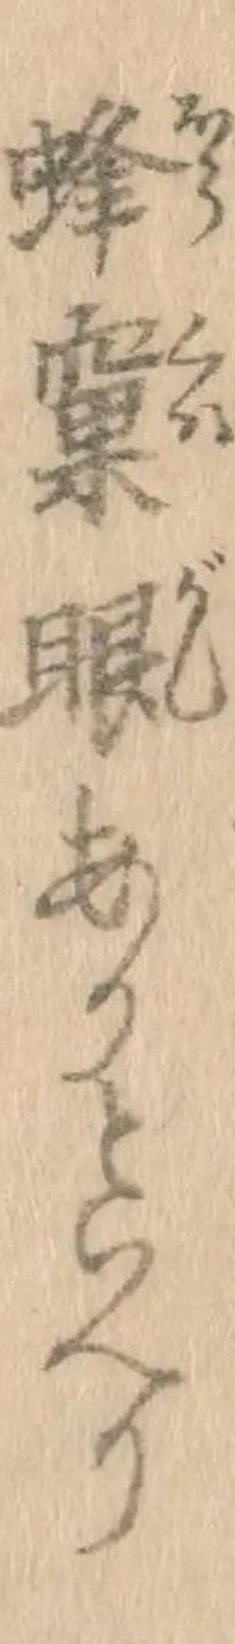蜂窠眼ありといへり
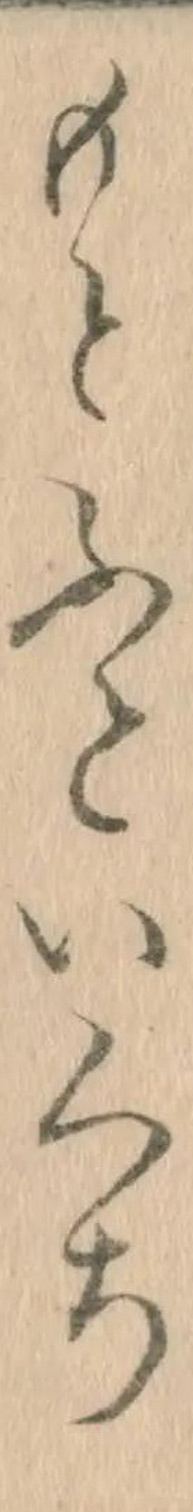もとふといくち
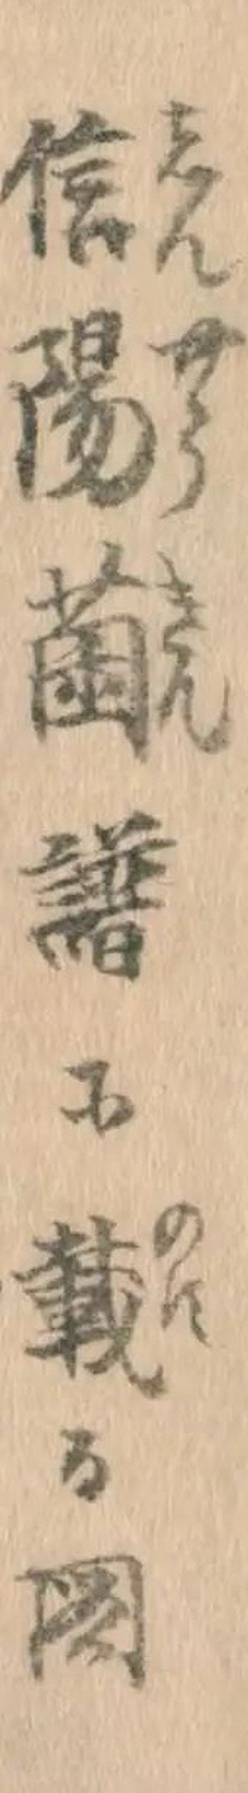信陽菌譜に載る図
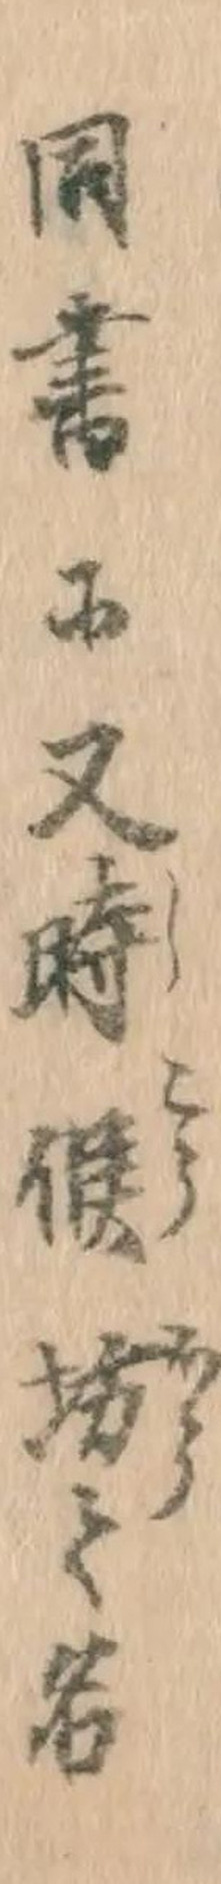同書に又時候坊と名
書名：本草図譜. 巻58-60
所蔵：国立国会図書館 National Diet Library, JAPAN
